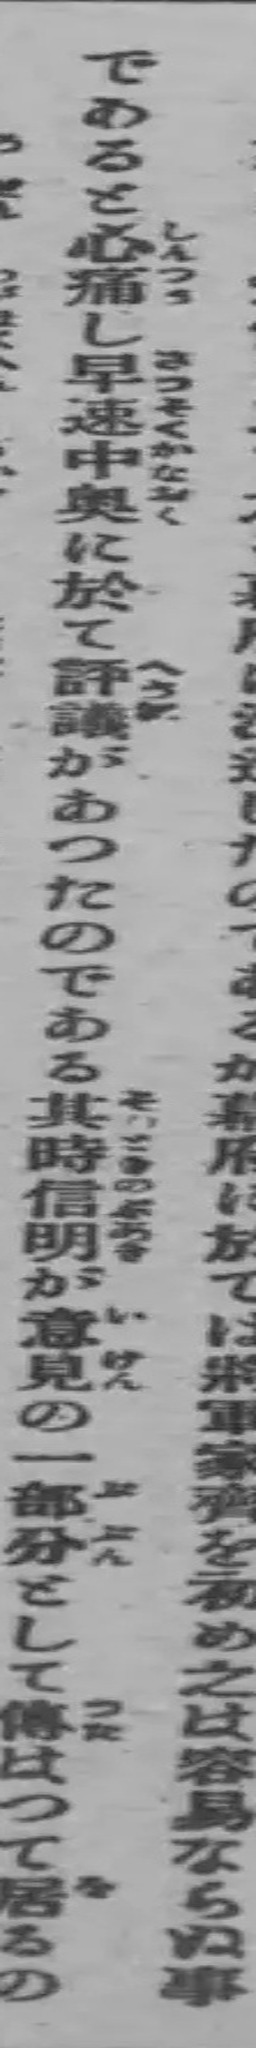であると心痛し早速中奥に於て評議があつたのである其時信明が意見の一部分として伝はつて居るの
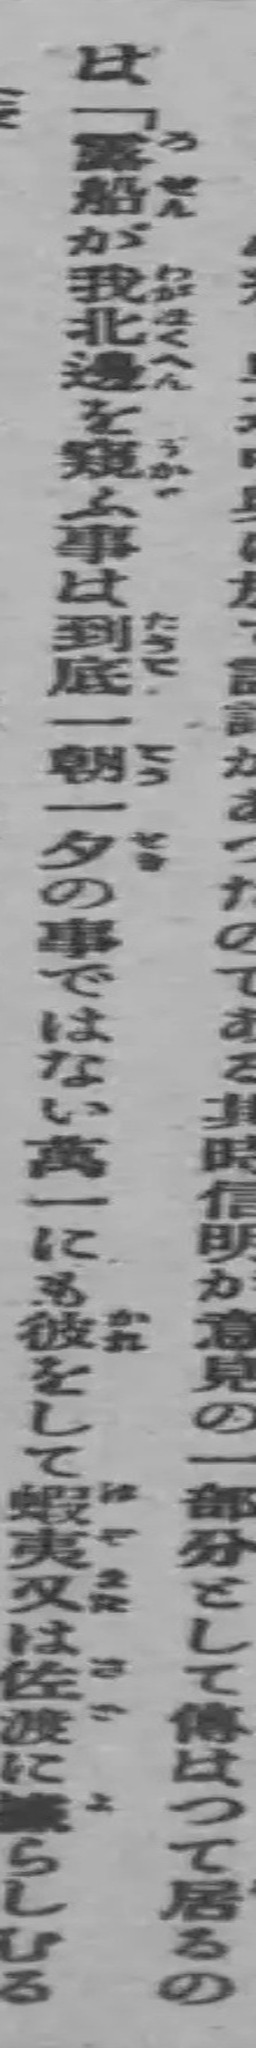は「露船が我北辺を窺ふ事は到底一朝一夕の事ではない万一にも彼をして蝦夷又は佐渡に拠らしむる
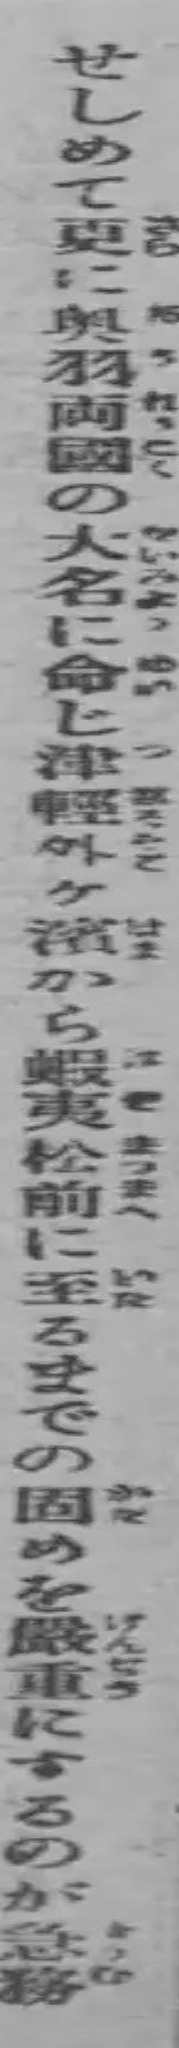せしめて更に奥羽両国の大名に命じ津軽外ケ浜から蝦夷松前に至るまでの固めを厳重にするのが急務
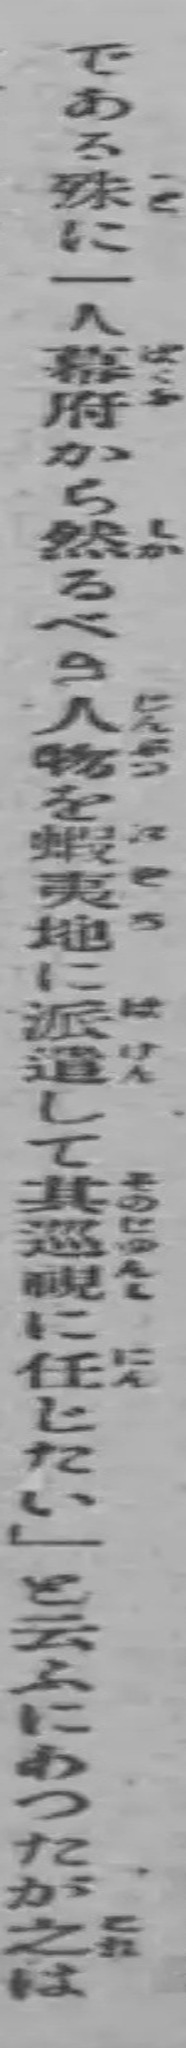である殊に一人幕府から然るべき人物を蝦夷地に派遣して其巡視に任じたい」と云ふにあつたが之は
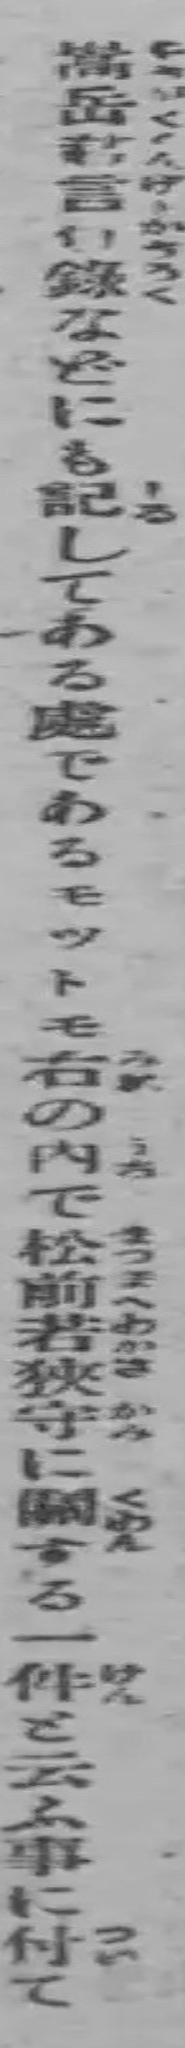嵩岳君言行録などにも記してある処であるモツトモ右の内で松前若狭守に関する一件と云ふ事に付て
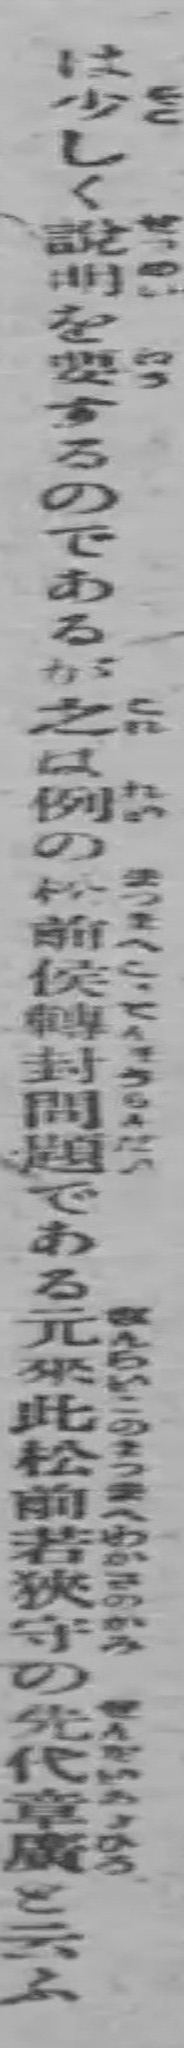は少しく説明を要するのであるが之は例の松前侯転封問題である元来此松前若狭守の先代章広と云ふ
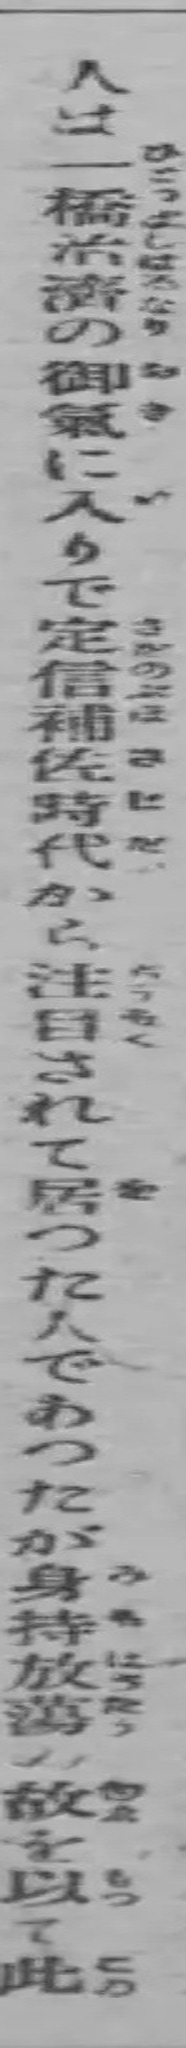人は一橋治済の御気に入りで定信補佐時代から注目されて居つた人であつたが身持放蕩の故を以て此
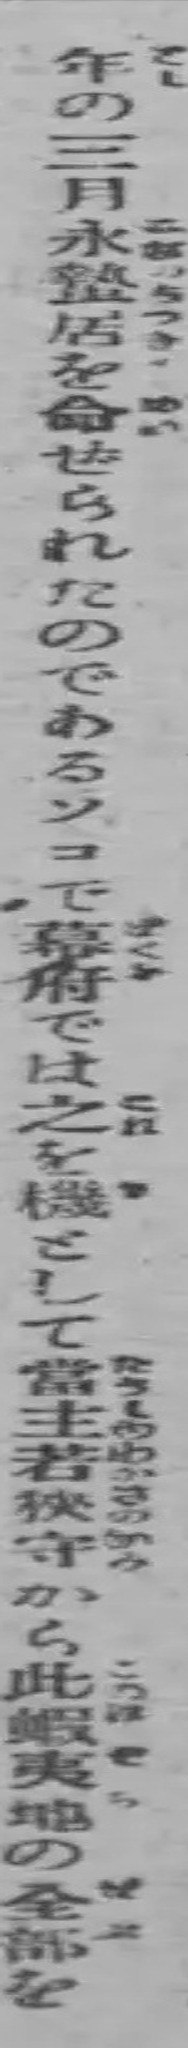年の三月永蟄居を命ぜられたのであるソコで幕府では之を機として当主若狭守から此蝦夷地の全部を
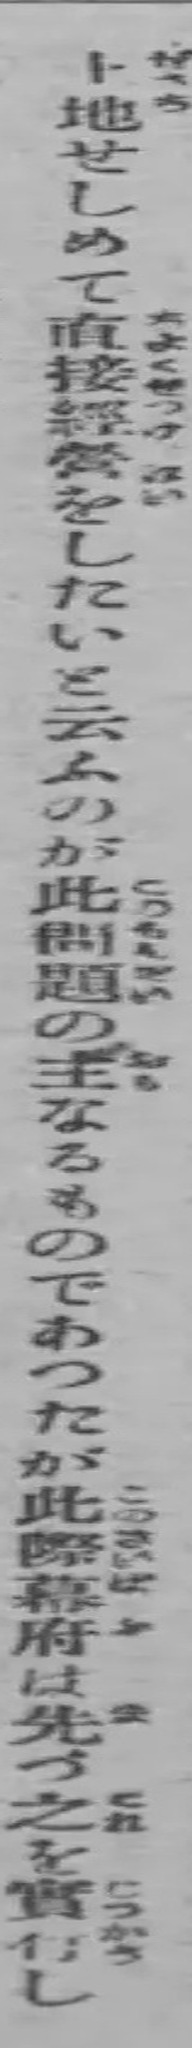上地せしめて直接経営をしたいと云ふのが此問題の主なるものであつたが此際幕府は先づ之を実行し
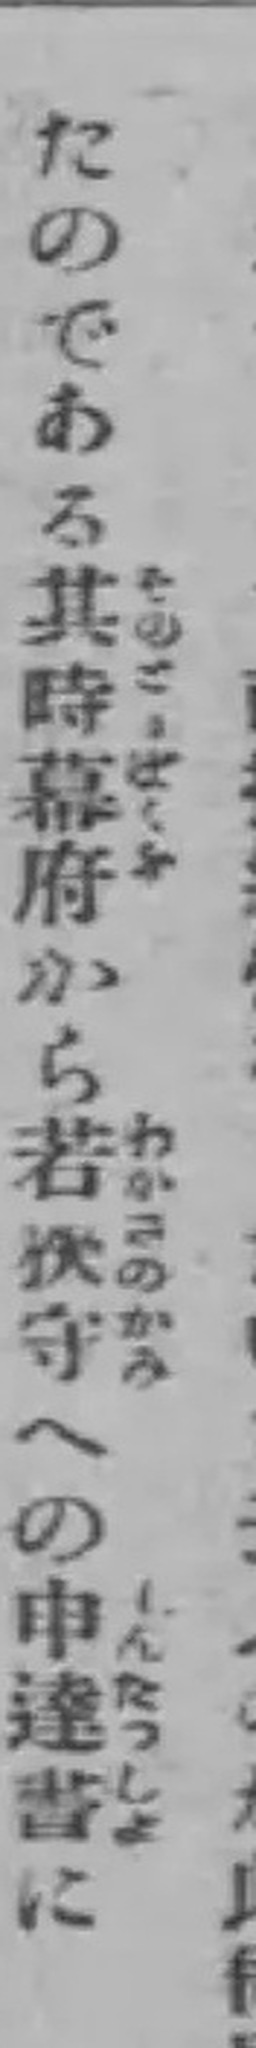たので其時幕府から若狭守への申達書に
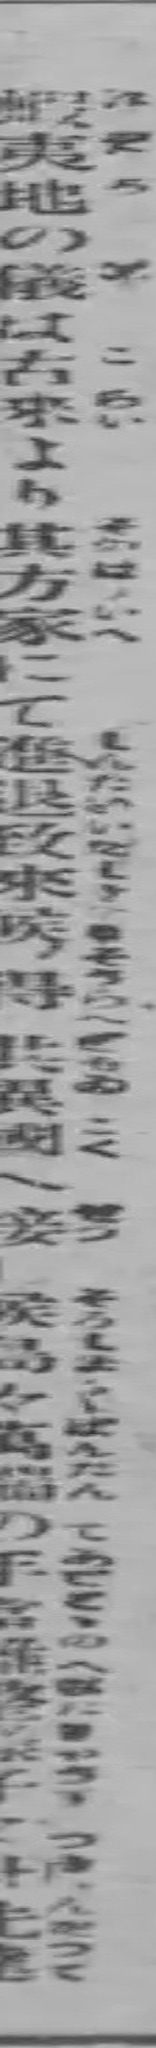蝦夷地の儀は古来より其方家にて進退致来候得共異国へ接し候島々万端の手当難整様子に付先達
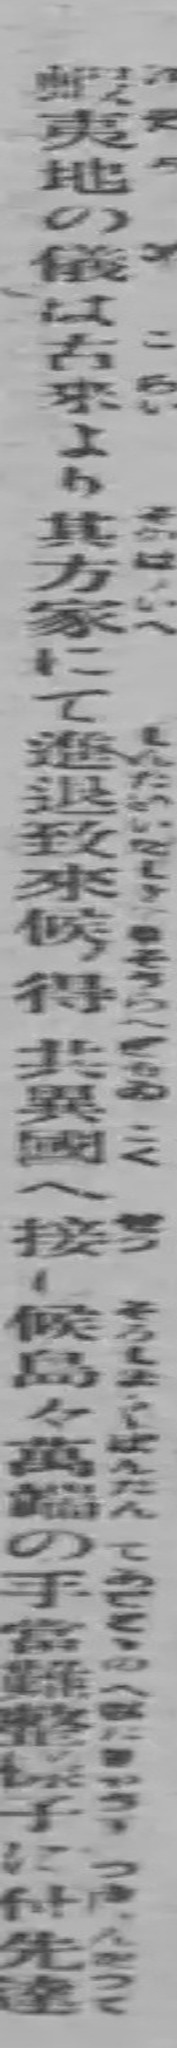蝦夷地の儀は古来より其方家にて進退致来候得共異国へ接し候島々万端の手当難整様子に付先達
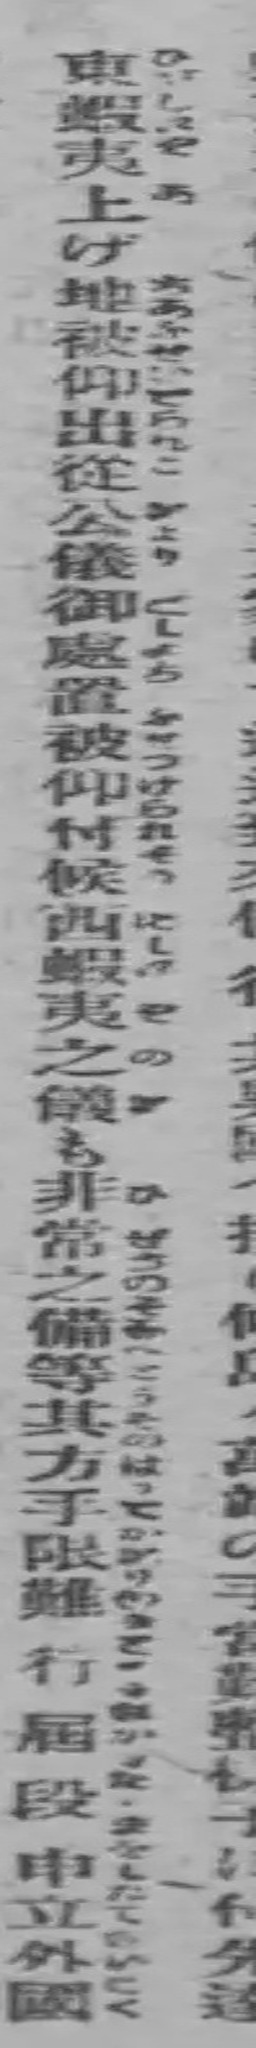東蝦夷上げ地被仰出従公儀御処置被仰付候西蝦夷之儀も非常之備等其方手限難行届段申立外国
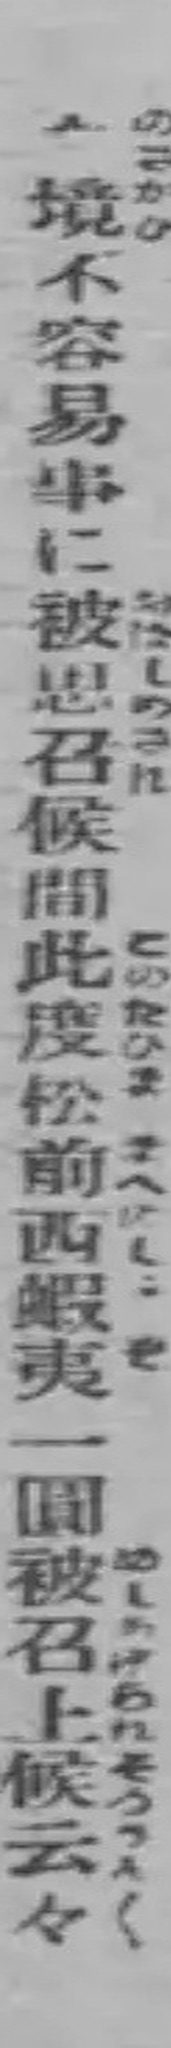之境不容易事に被思召候間此度松前西蝦夷一円被召上候云々
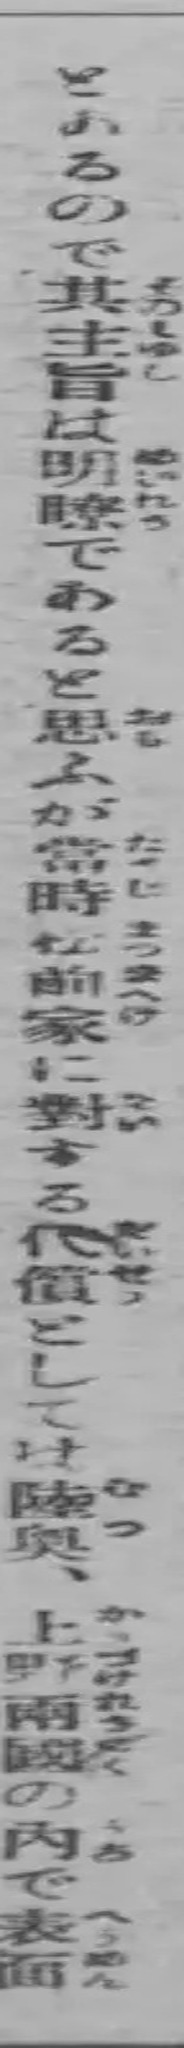とあるので其主旨は明瞭であると思ふが当時松前家に対する代償としては陸奥、上野両国の内で表面
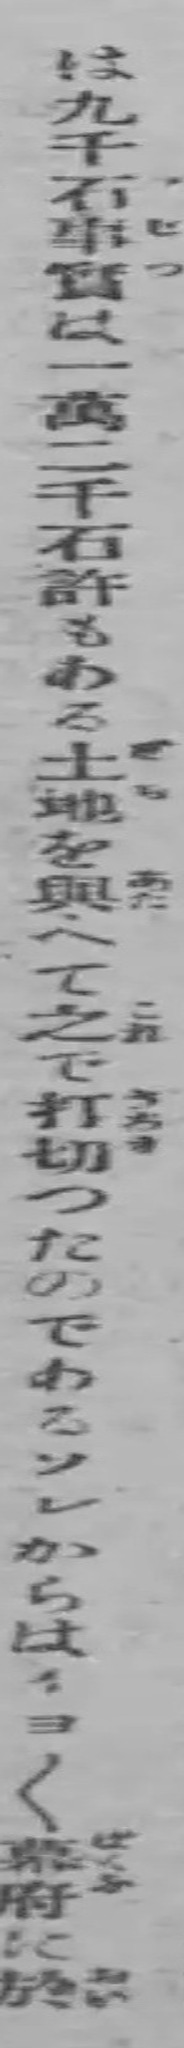は九千石事実は一万二千石許もある土地を与へて之で打切つたのであるソレからはイヨ〳〵幕府に於
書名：豊橋市史談
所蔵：国立国会図書館 National Diet Library, JAPAN
